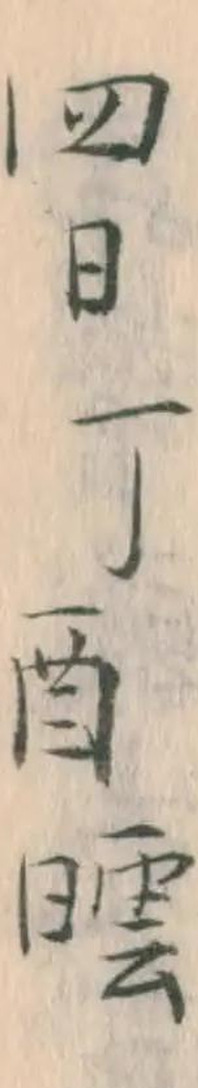四日丁酉曇
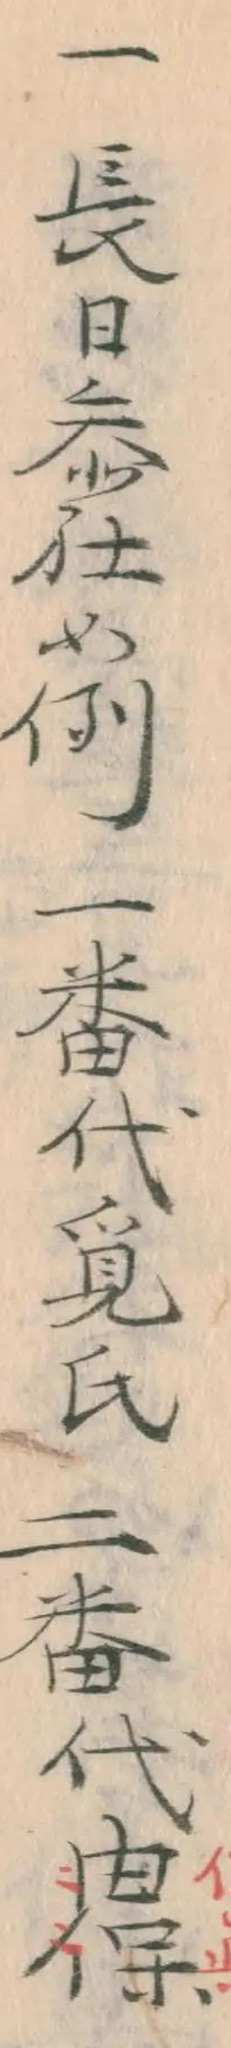一長日参社如例一番代覓氏二番代由保
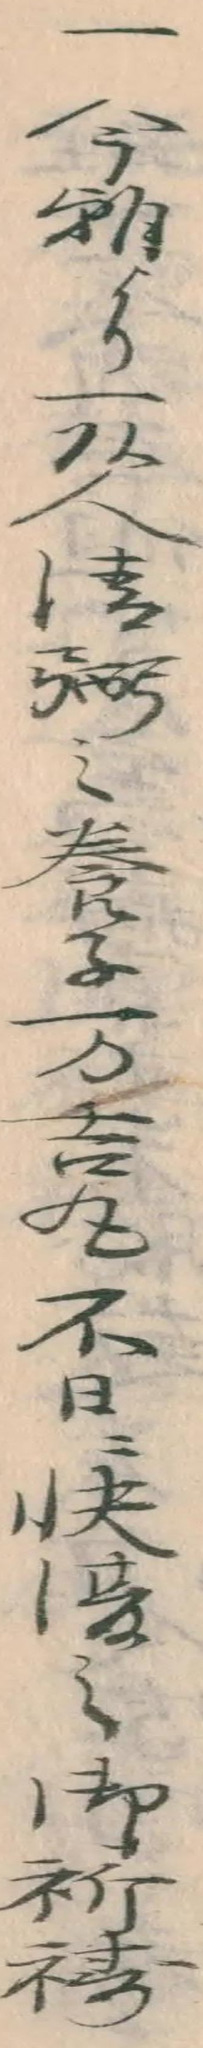一今朝より一頭人清弼之養子万吉丸不日ニ快復之御祈祷
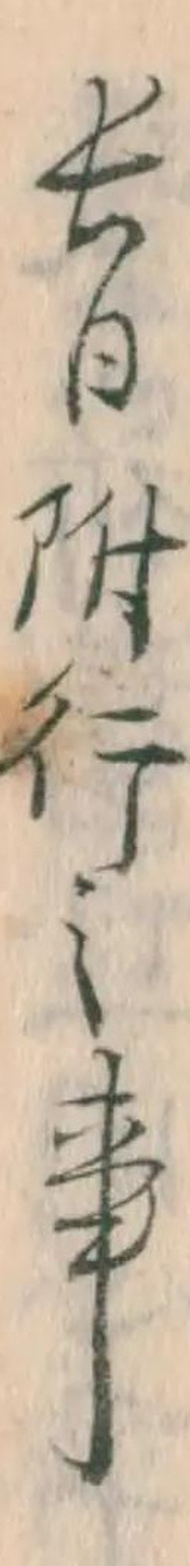長日附行之事
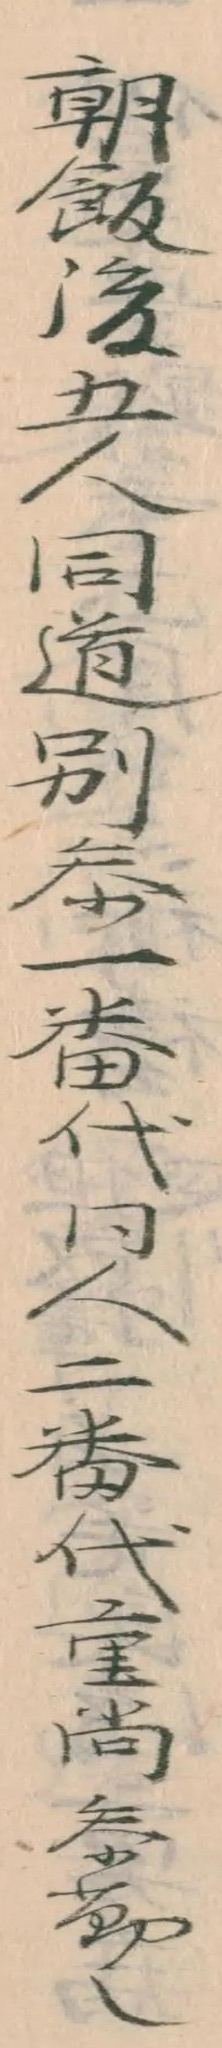一朝飯後五人同道別参一番代同人二番代重尚参勤之
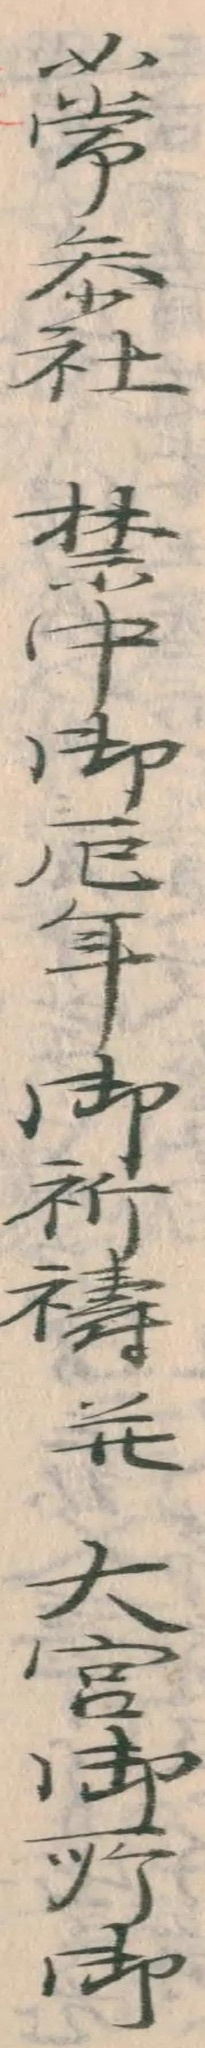如常参社禁中御厄年御祈祷并大宮御所御
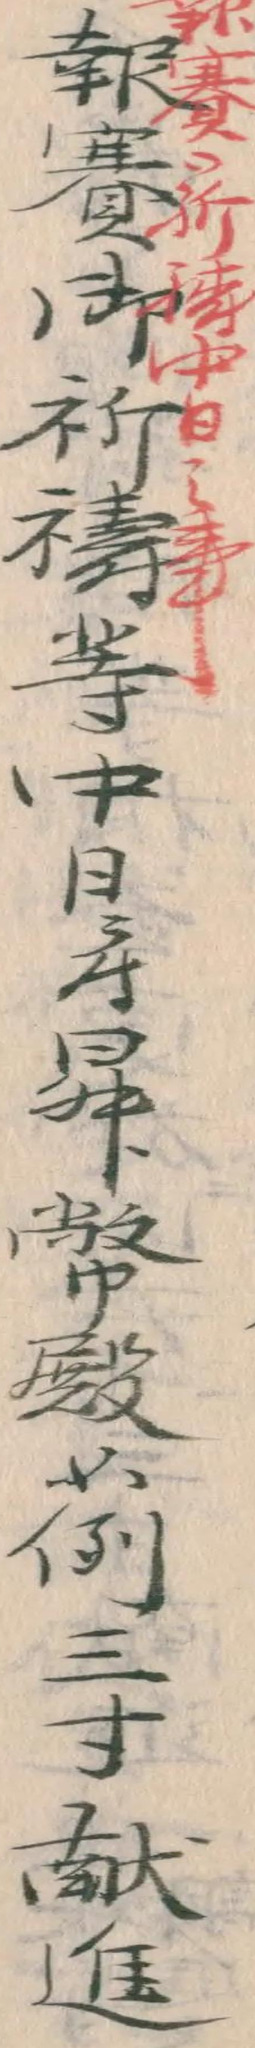報賽御祈祷等中日ニ付昇幣殿如例三寸献進
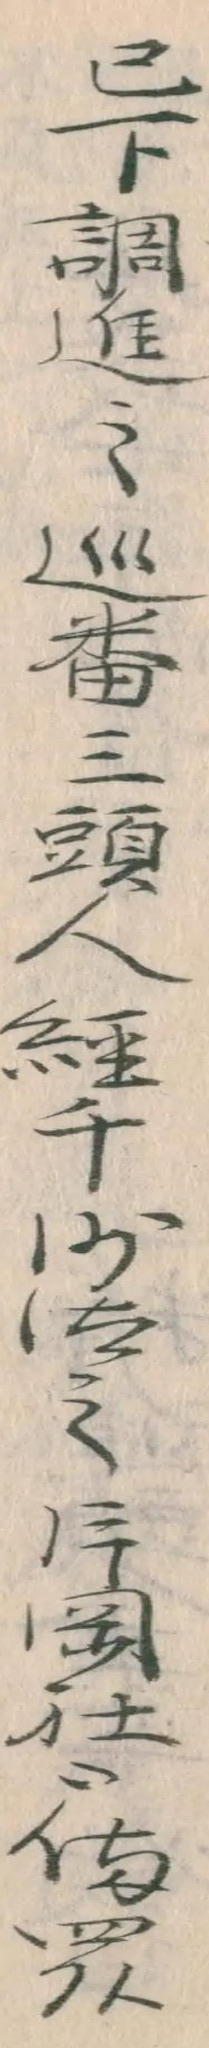已下調進也巡番三頭人経千沙汰也片岡社御備四頭
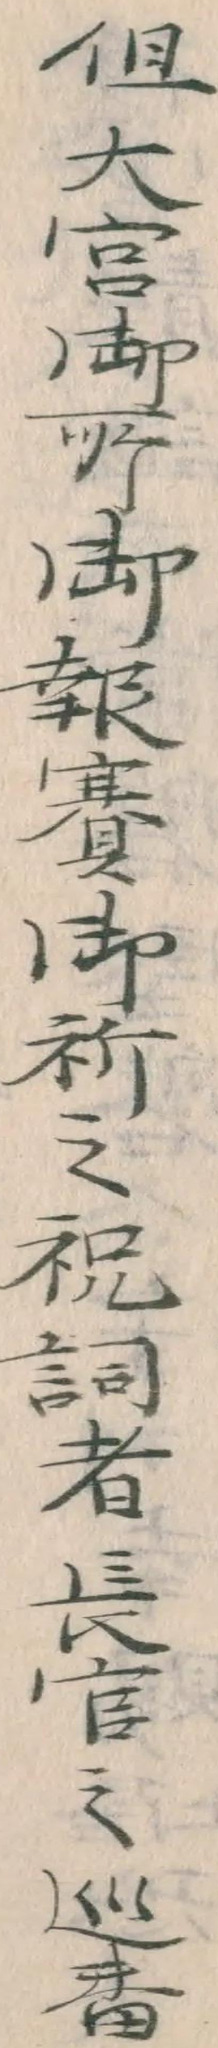但大宮御所御報賽御祈之祝詞者長官之巡番
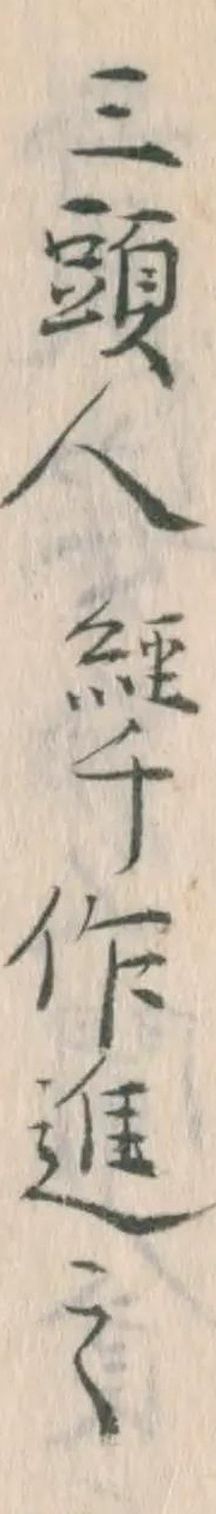三頭人経千作進之
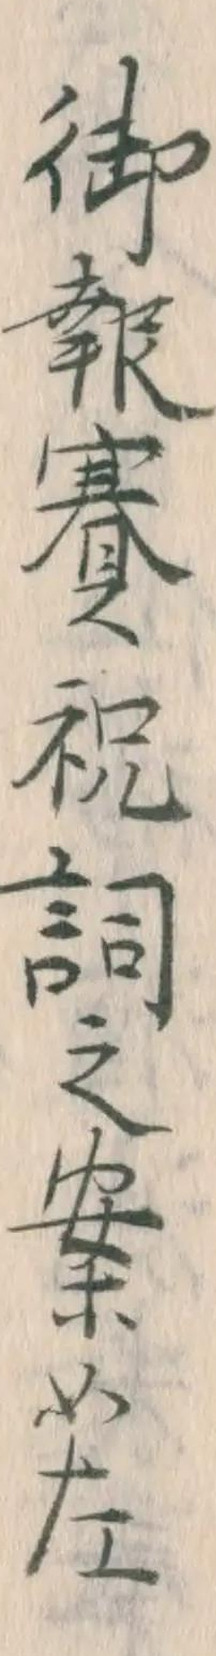御報賽祝詞之案如左
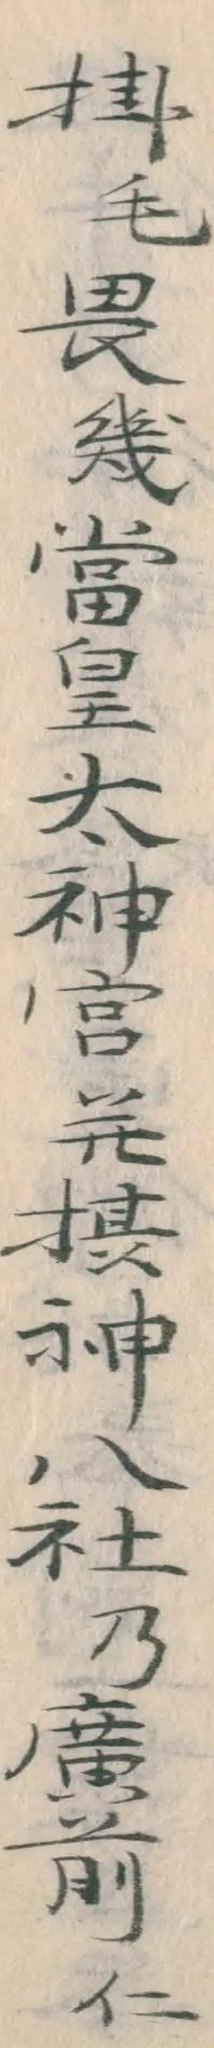掛毛畏幾當皇太神宮并摂神八社乃廣前仁
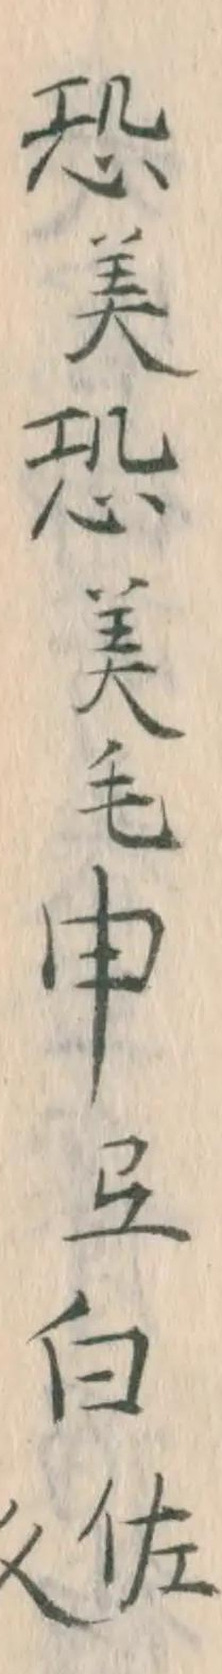恐美恐美毛申弖白佐久

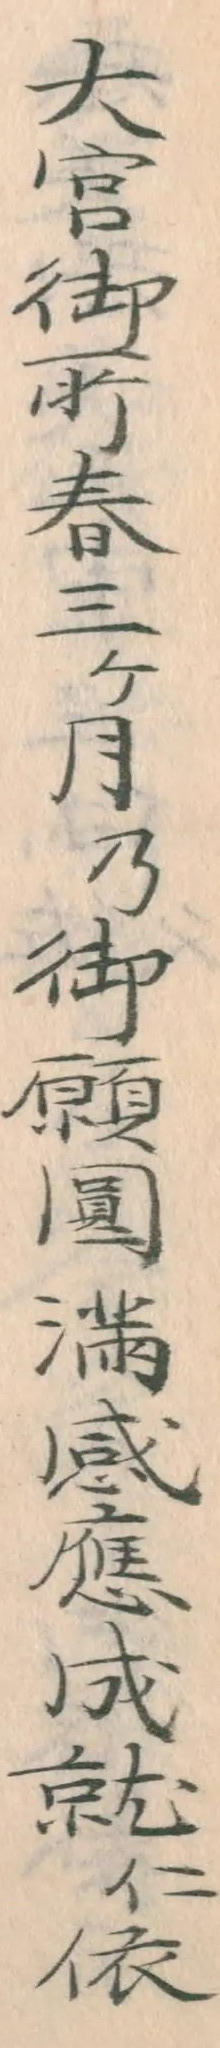大宮御所春三ヶ月乃御願圓満感應成就仁依
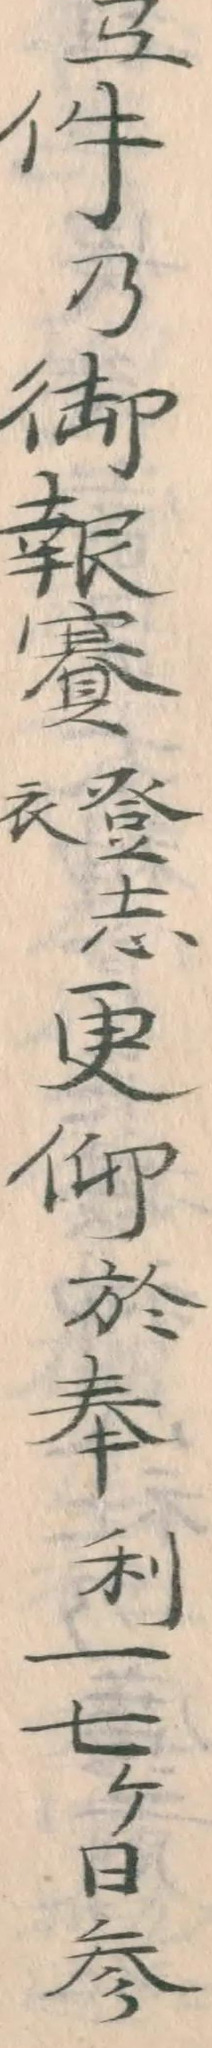弖件乃御報賽登志依更仰於奉利一七ケ日参
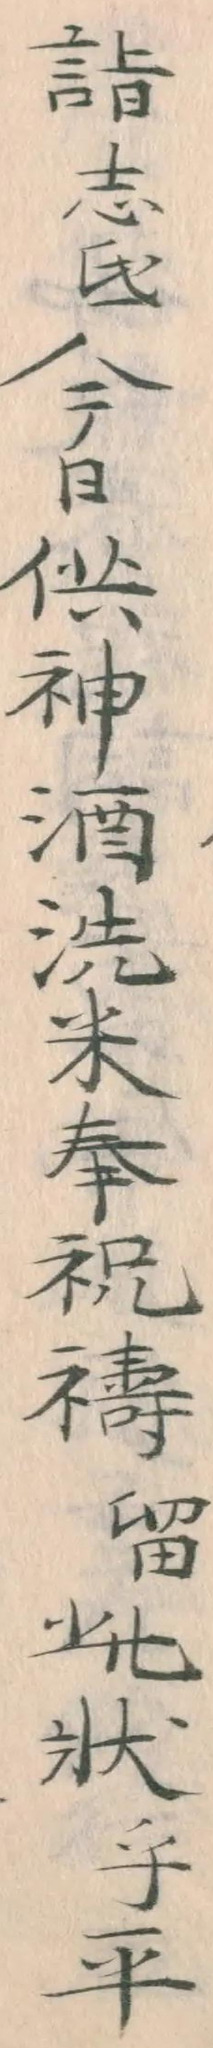詣志弖今日供神酒洗米奉祝祷留此状乎平
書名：賀茂社記録. 第73冊
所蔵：国立国会図書館 National Diet Library, JAPAN
